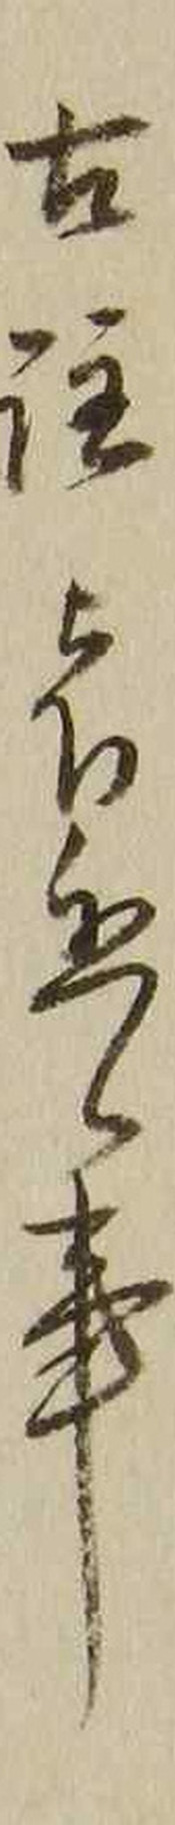古註被下置候事
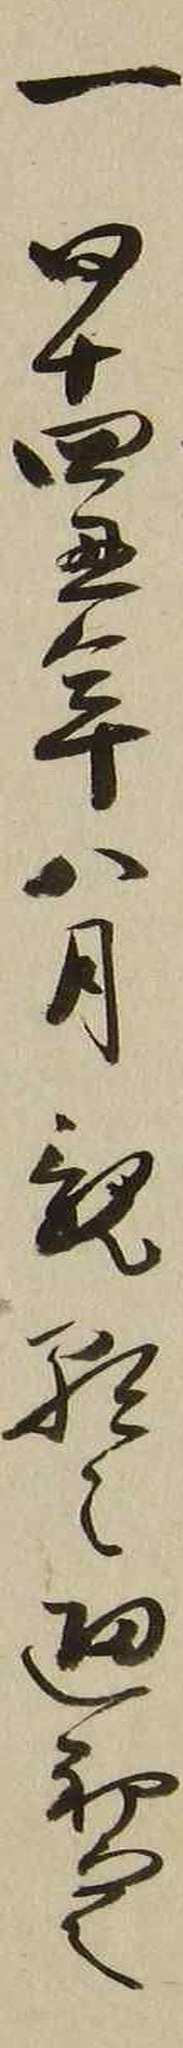一同十四丑年八月親願之通初而之
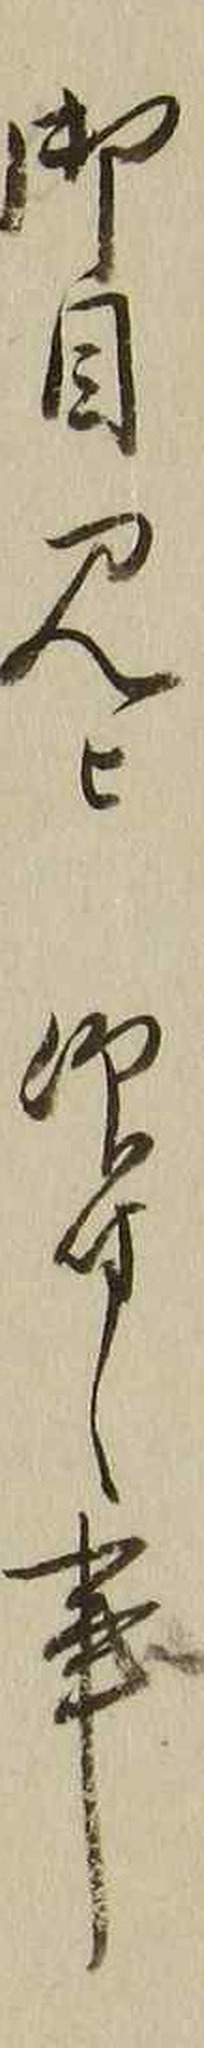御目見被仰付候事
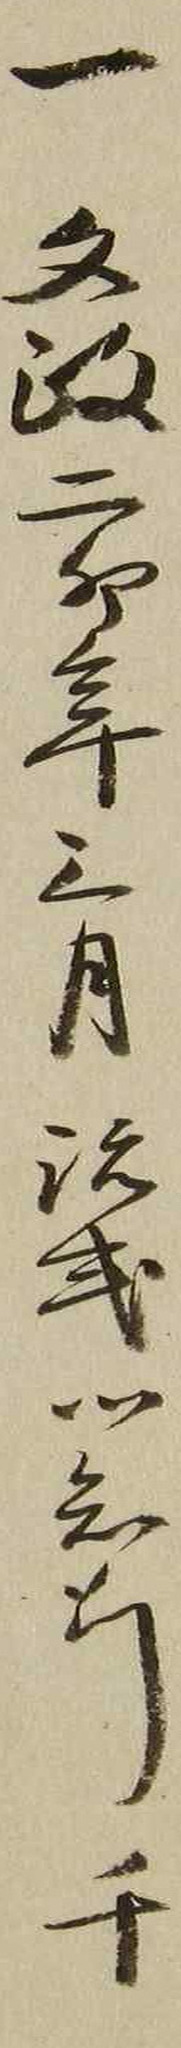一文政二卯年三月跡式御知行千
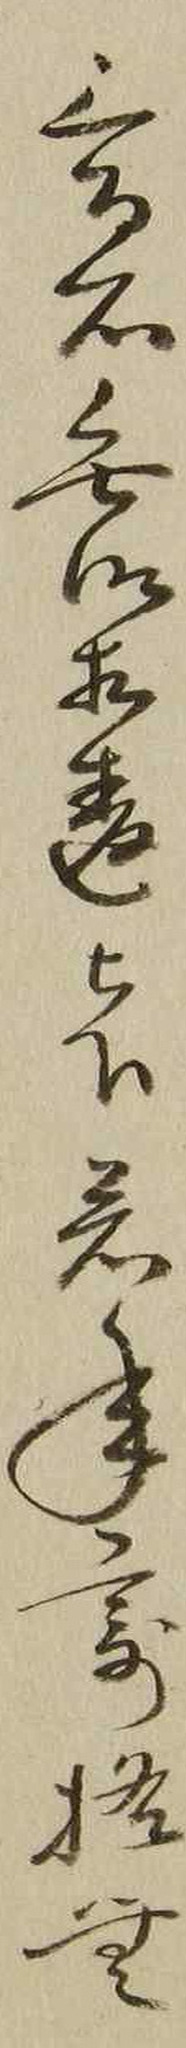三百石無御相違被下若年寄格無
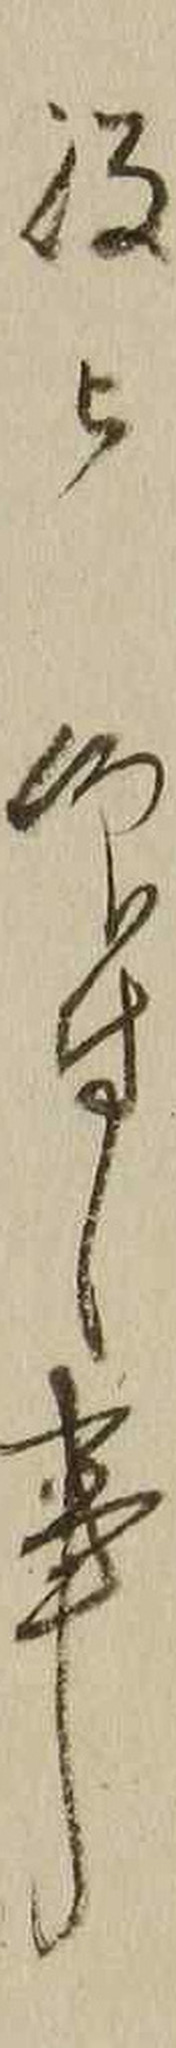役被仰付候事
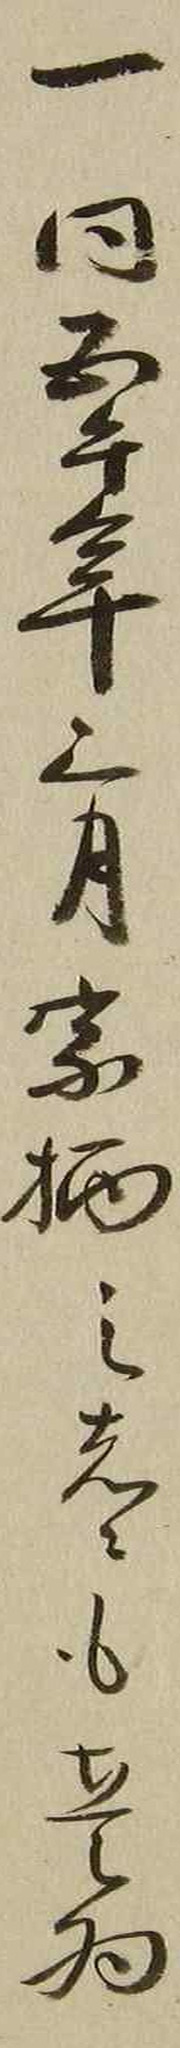一同五午年三月家柄之者にも有之為
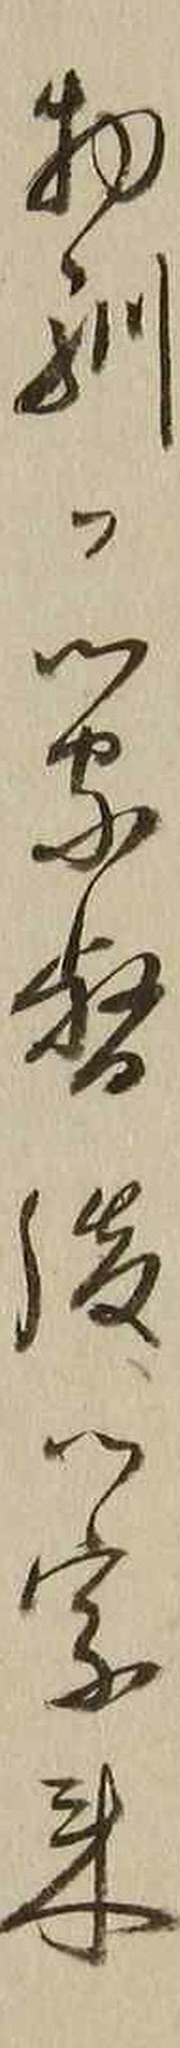物馴候御家督後御家来
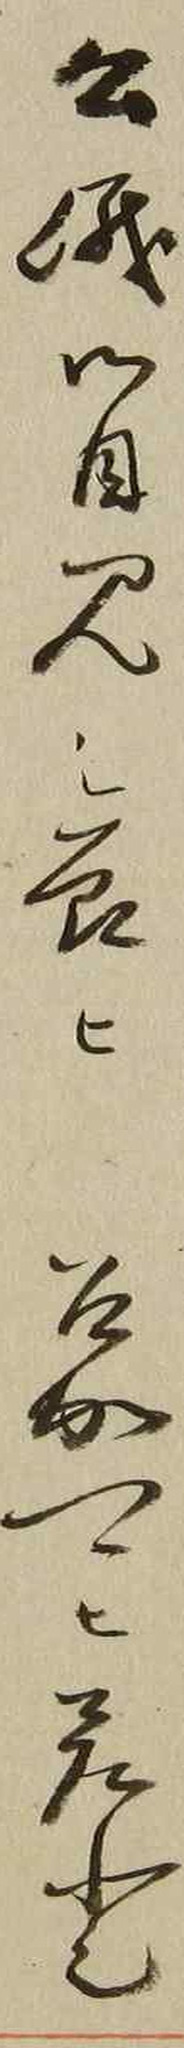公儀御目見之節被召出可被差登
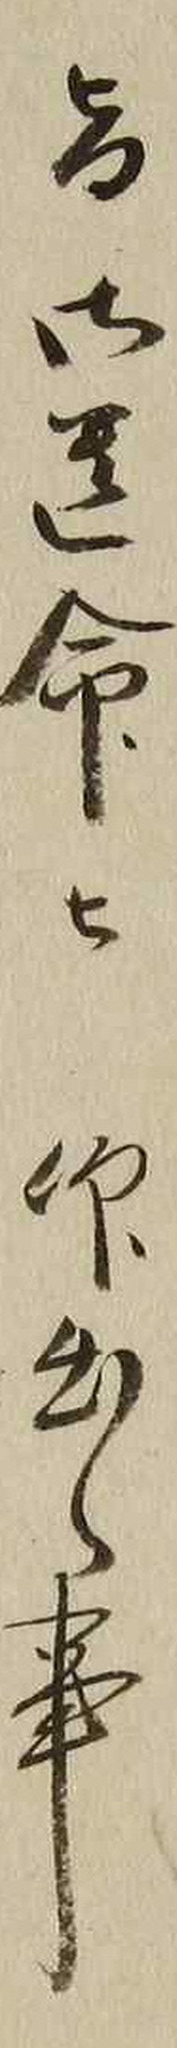旨御遺命被仰出候事
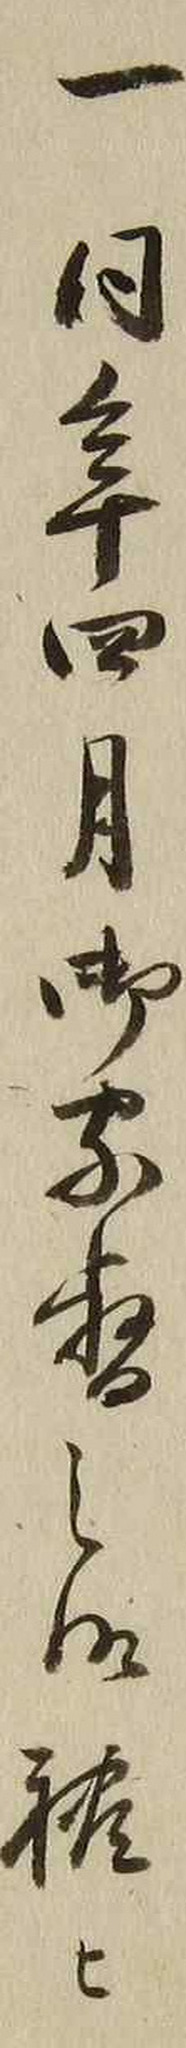一同年四月御家督之御礼被
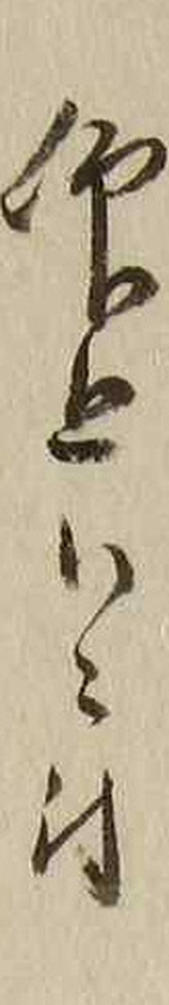仰上候に付
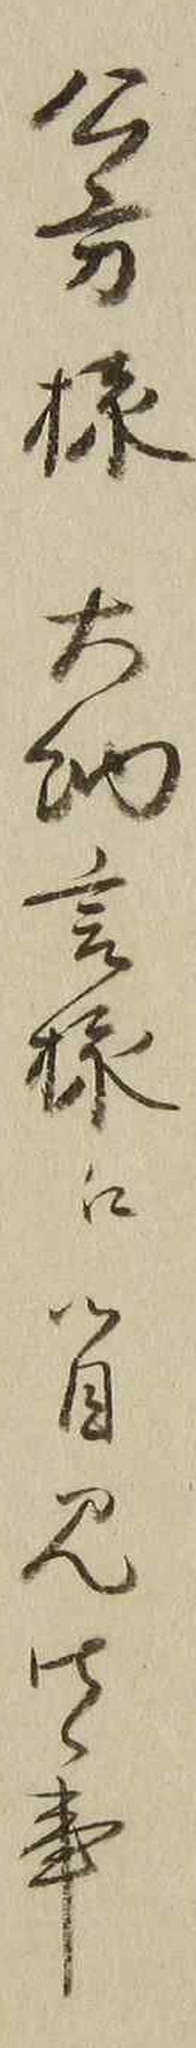公方様大納言様江御目見仕候事
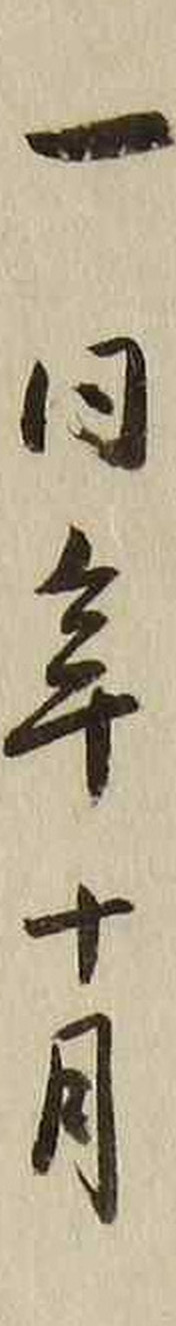一同年十月
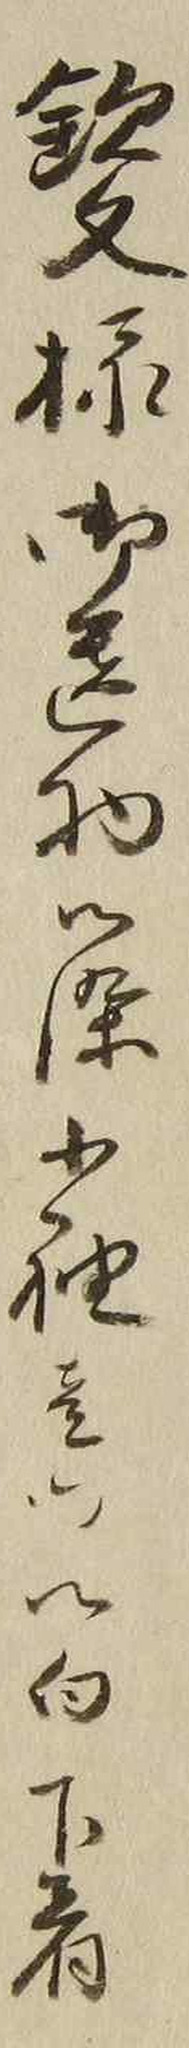欽文様御遺物御染小袖壱つ御白下着
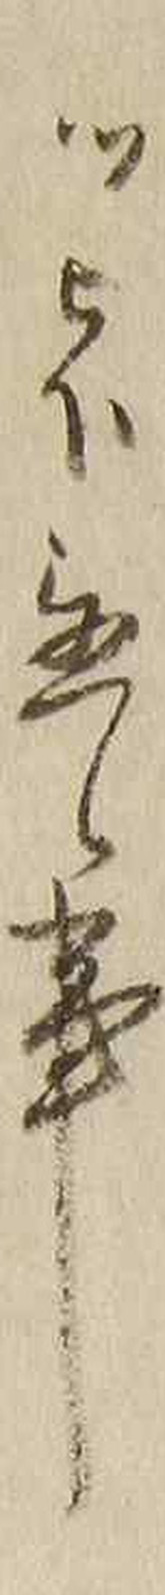つ被下置候事
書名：諸士系譜　巻之269　さ之部1
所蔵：会津若松市立会津図書館
